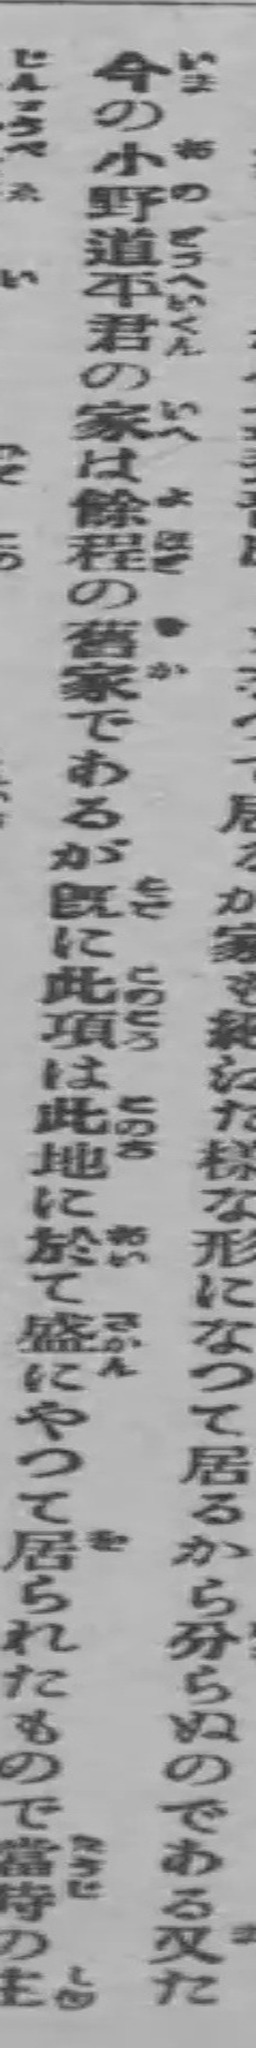今の小野道平君の家は余程の旧家であるが既に此頃は此地に於て盛にやつて居られたもので当時の主
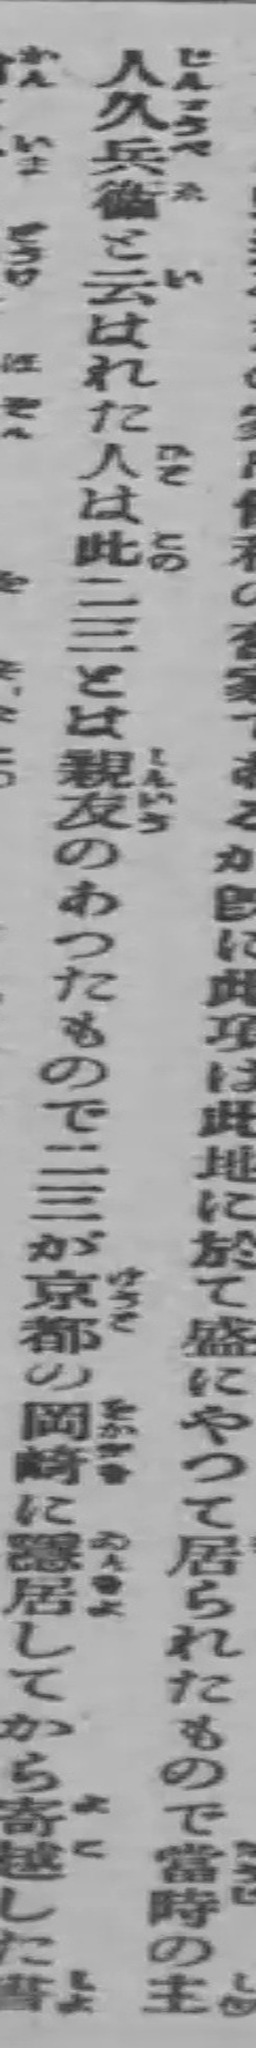人久兵衛と云はれた人は此二三とは親友のあつたもので二三が京都の岡崎に隠居してから寄越した書
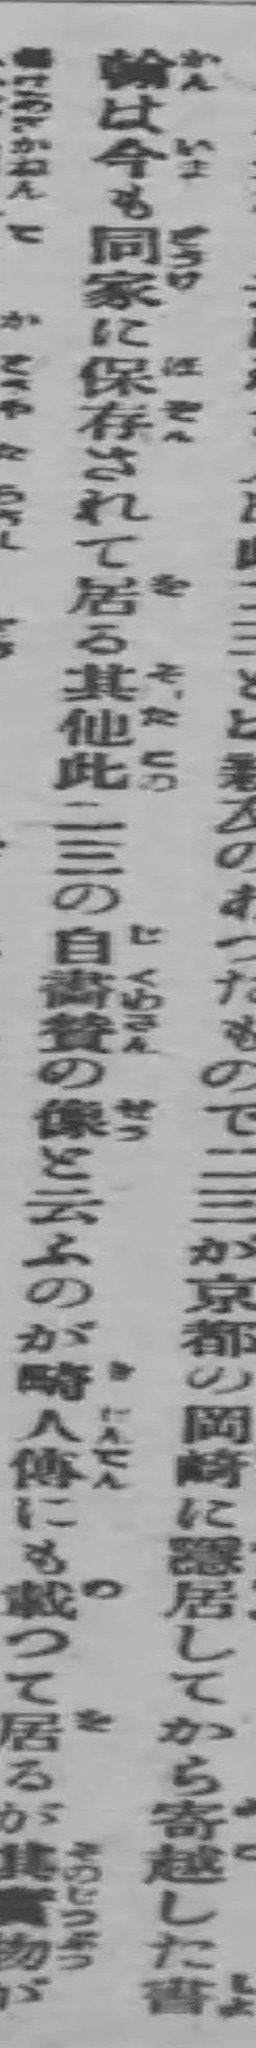翰は今も同家に保存されて居る其他此二三の自画賛の像と云ふのが畸人伝にも載つて居るが其実物が
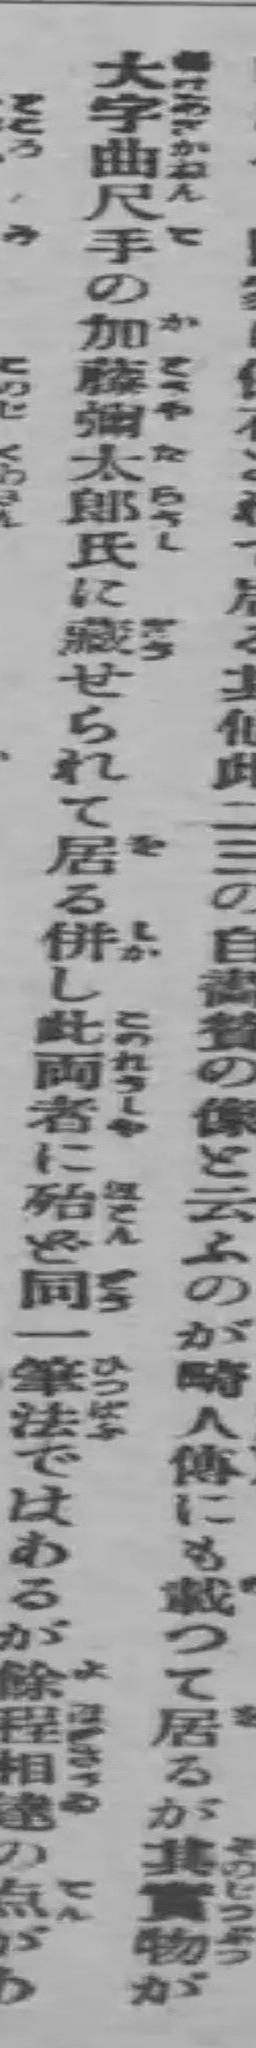大字曲尺手の加藤彌太郎氏に蔵せられて居る併し此両者に殆ど同一筆法ではあるが余程相違の点があ
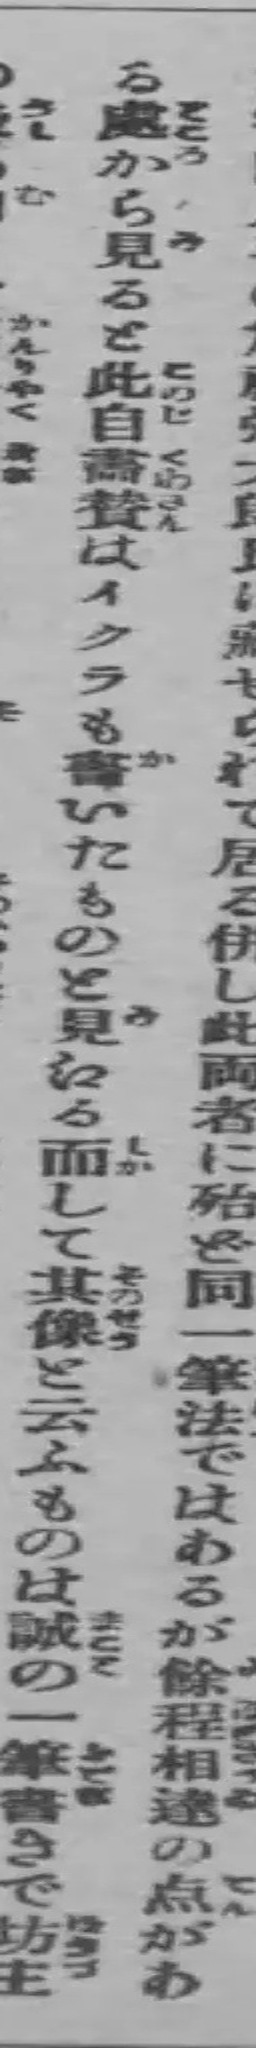る処から見ると此自画賛はイクラも書いたものと見える而して其像と云ふものは誠の一筆書きで坊主
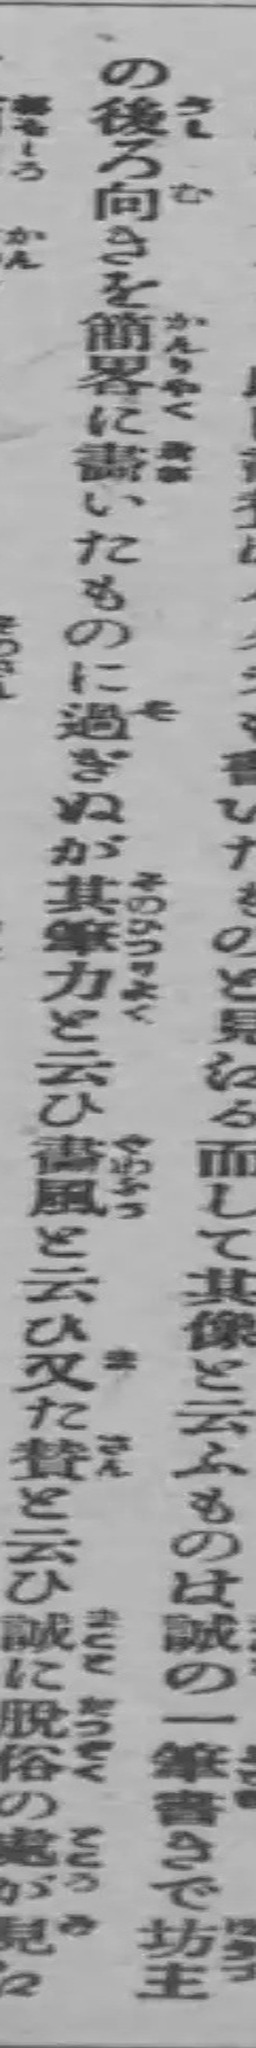の後ろ向きを簡略に画いたものに過ぎぬが其筆力と云ひ画風と云ひ又又た賛と云ひ誠に脱俗の処が見え
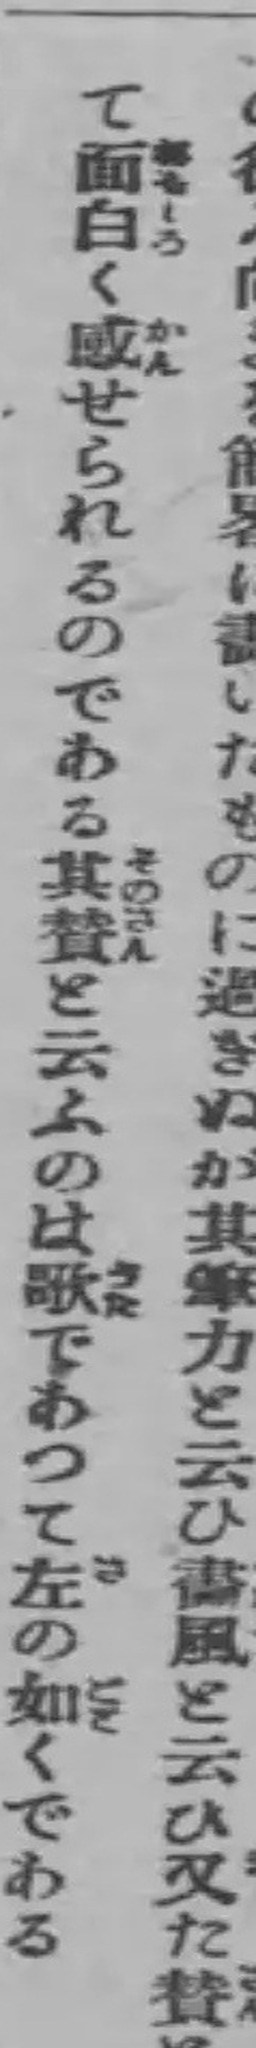て面白く感せられるのである其賛と云ふのは歌であつて左の如くである
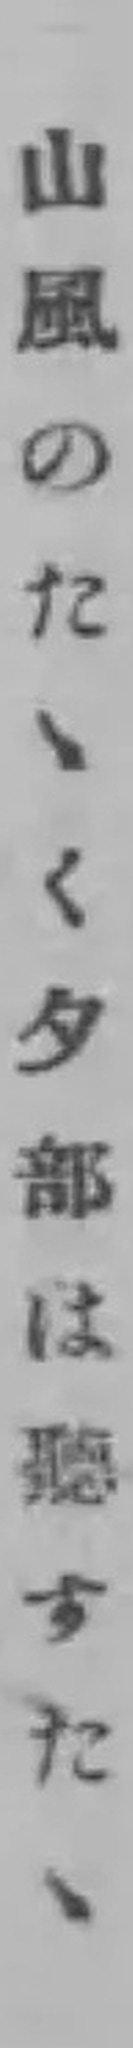山風のたゝく夕部は聴すたゝ
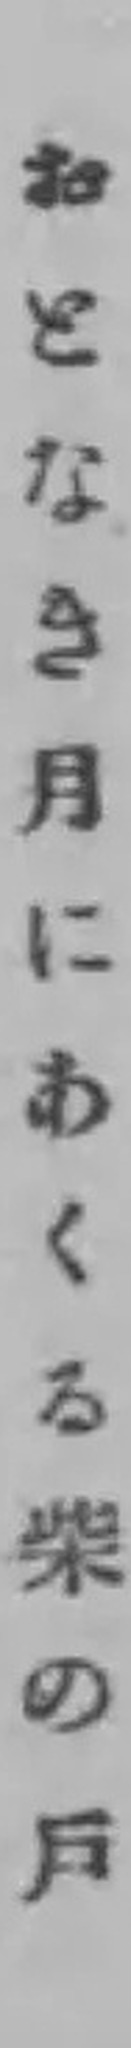おとなき月にあくる柴の戸
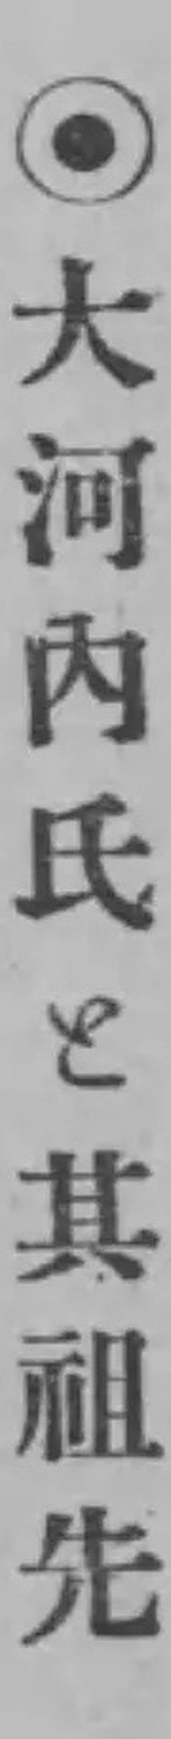⦿大河内氏と其祖先
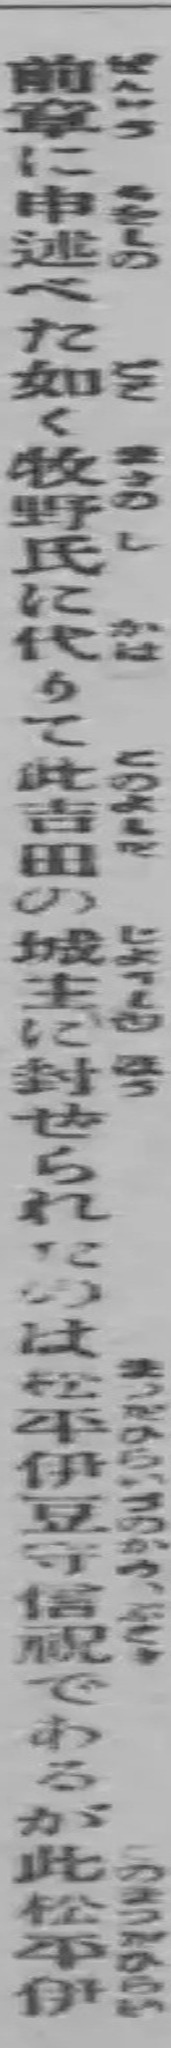前章に申述べた如く牧野氏に代りて此吉田の城主に封ぜられたのは松平伊豆守信祝であるが此松平伊
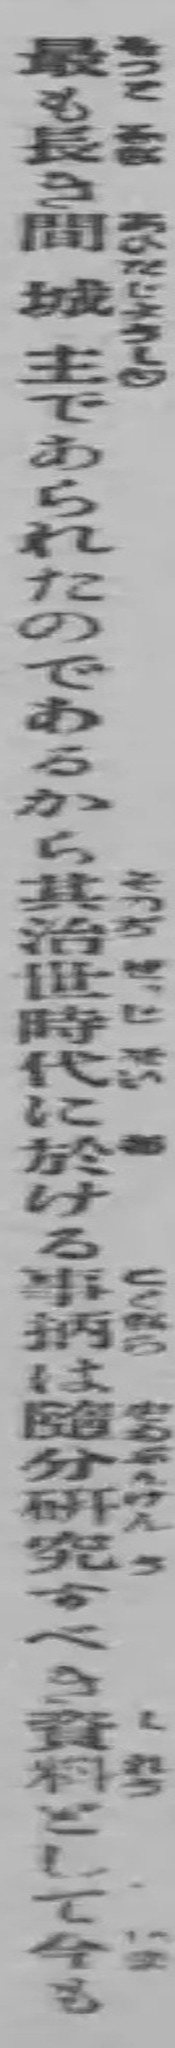最も長き間城主であられたのであるから其治世時代に於ける事柄は随分研究すべき資料として今も
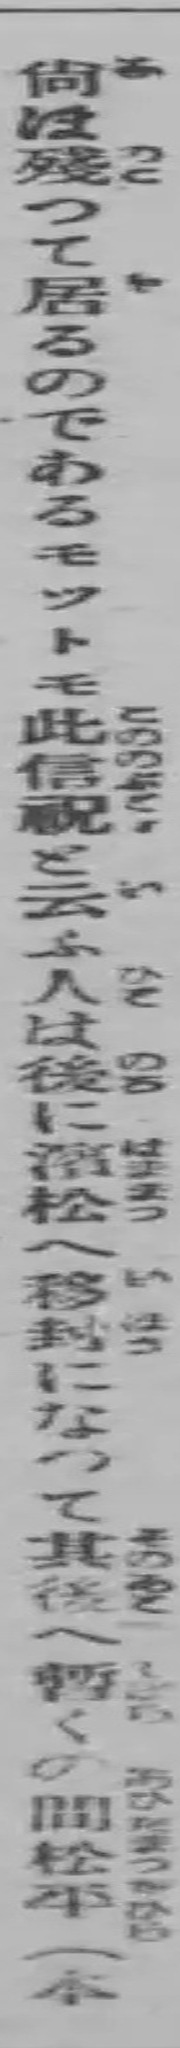尚ほ残つて居るのであるモツトモ此信祝と云ふ人は後に浜松へ移封になつて其後へ暫くの間松平(本
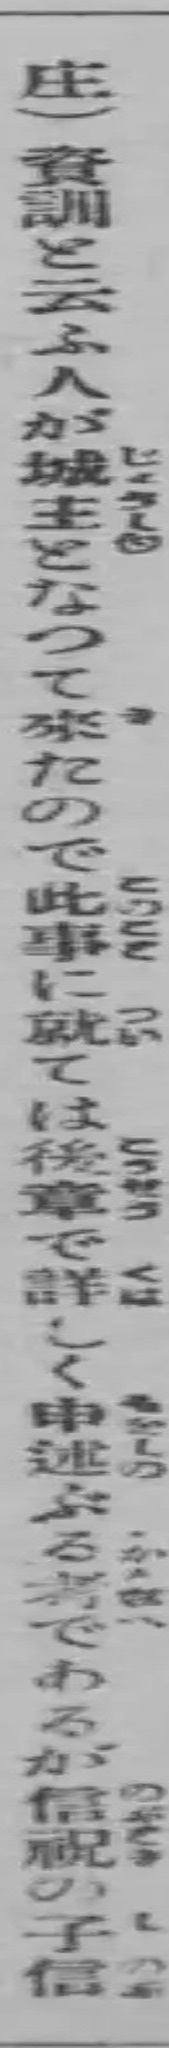庄)資訓と云ふ人が城主となつて来たので此事に就ては後章で詳しく申述ぶる考であるが信祝の子信
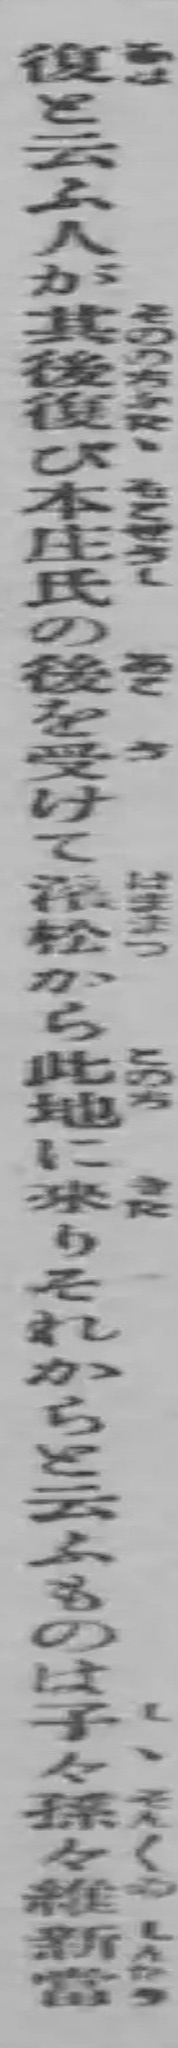復と云ふ人が其後復び本庄氏の後を受けて浜松から此地に来りそれからと云ふものは子々孫々維新当
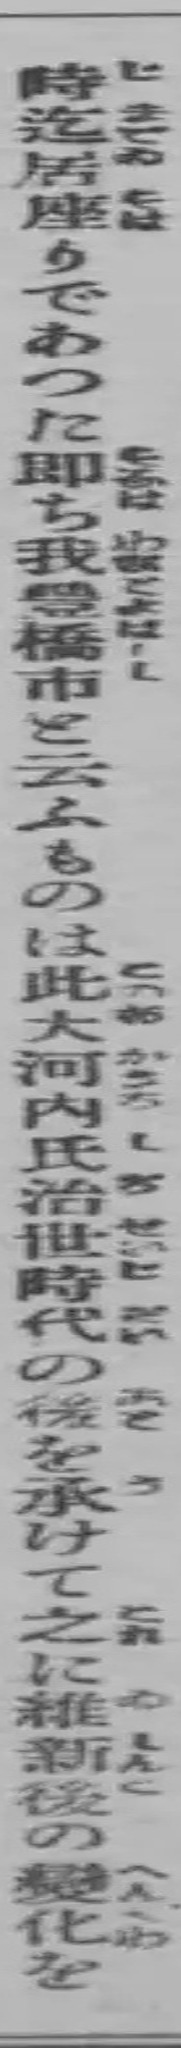時迄居座りであつた即ち我豊橋市と云ふものは此大河内氏治世時代の後を承けて之に維新後の変化を
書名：豊橋市史談
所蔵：国立国会図書館 National Diet Library, JAPAN
